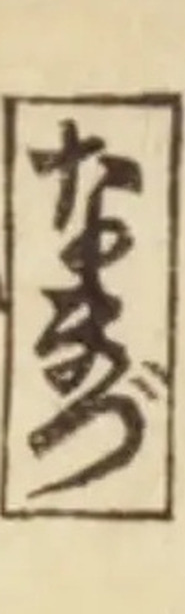なまづ
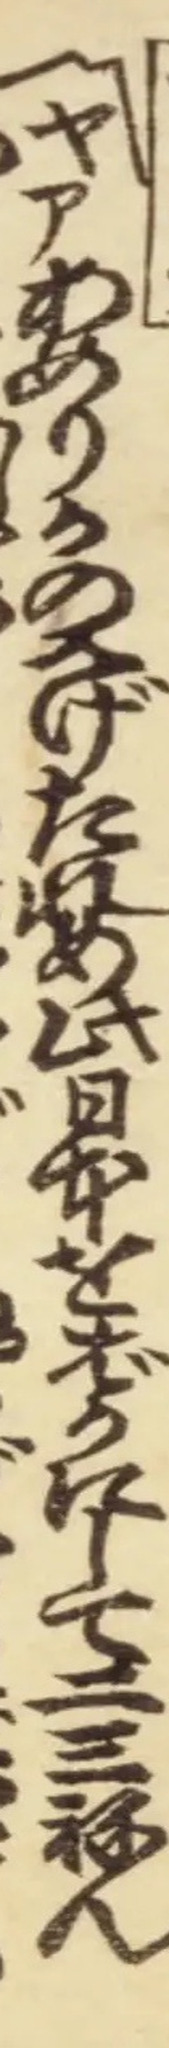〽ヤアあめりかのへげたれめ此日本をばかにして二三ねん
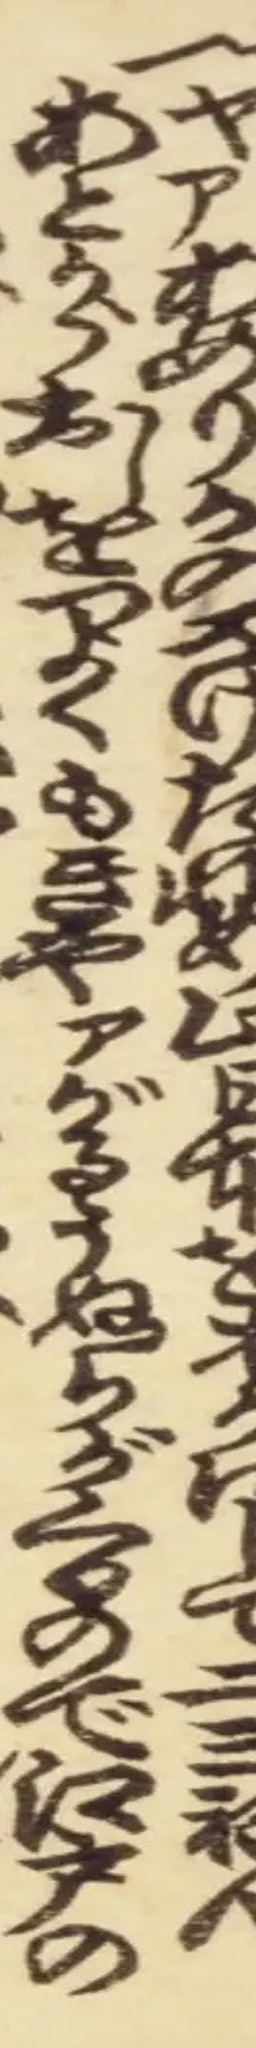あとからおしをつよくもきやアがるうぬらがくるので江戸の
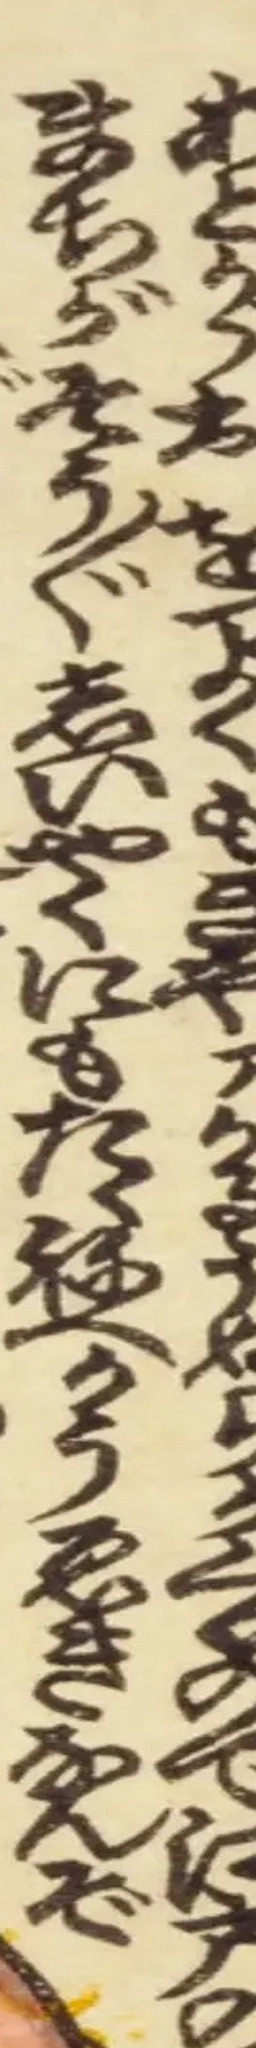まちがそう〴〵しいやくにもたゝねへかうゑきなんぞ
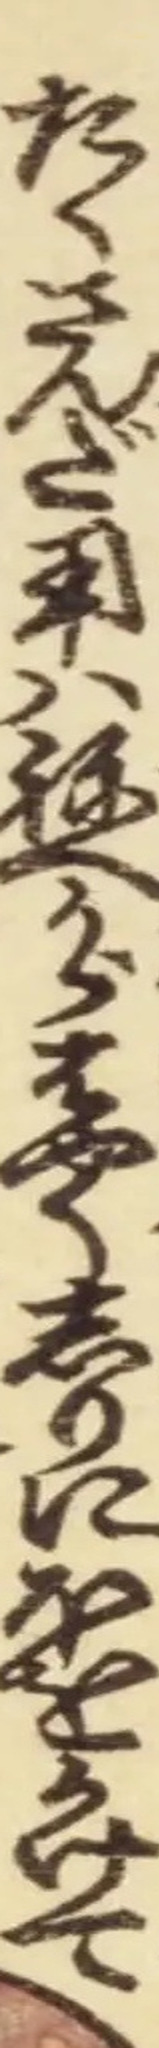たくさんだ用ハねへからはやくしりにほをかけて
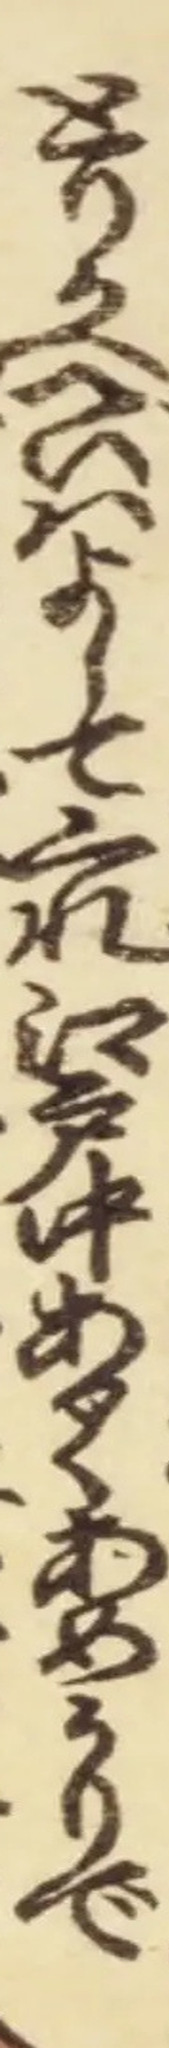とりかへべいはよしてくれ江戸中あるくあめうりで
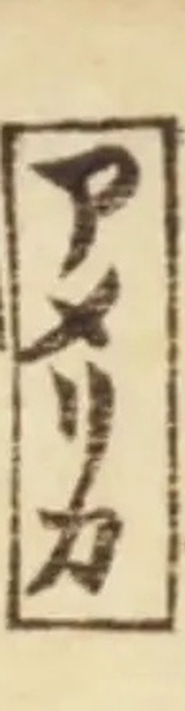アメリカ
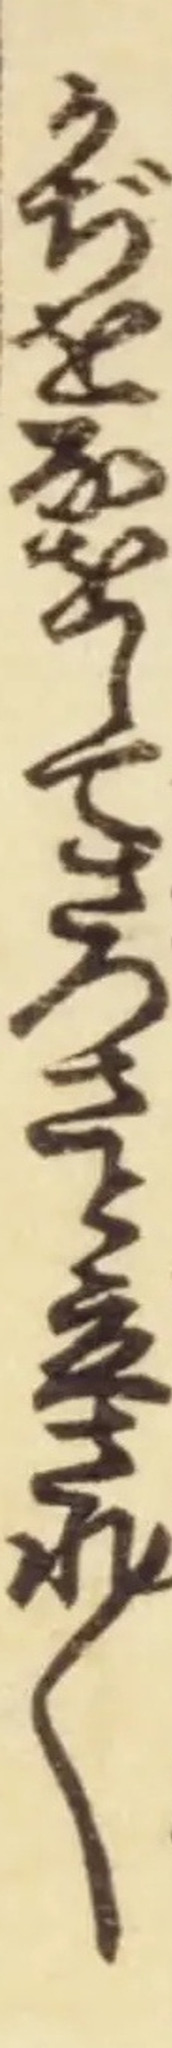かぢをなをしてさつさと立され〳〵
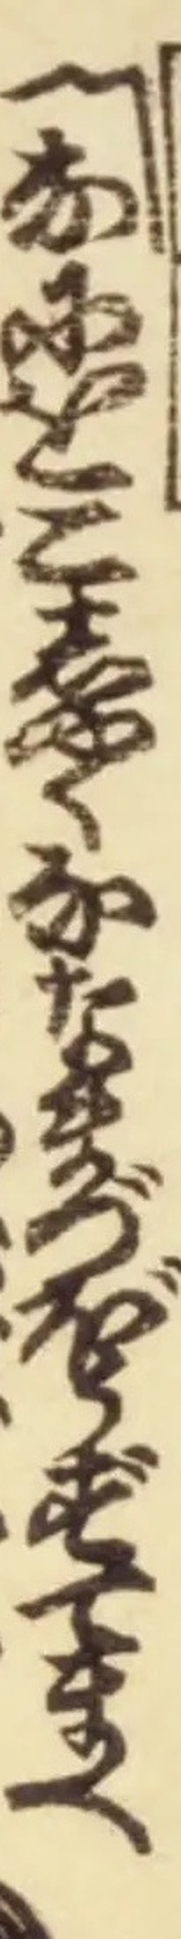〽なにをこしやくななまづぼうずてまへ
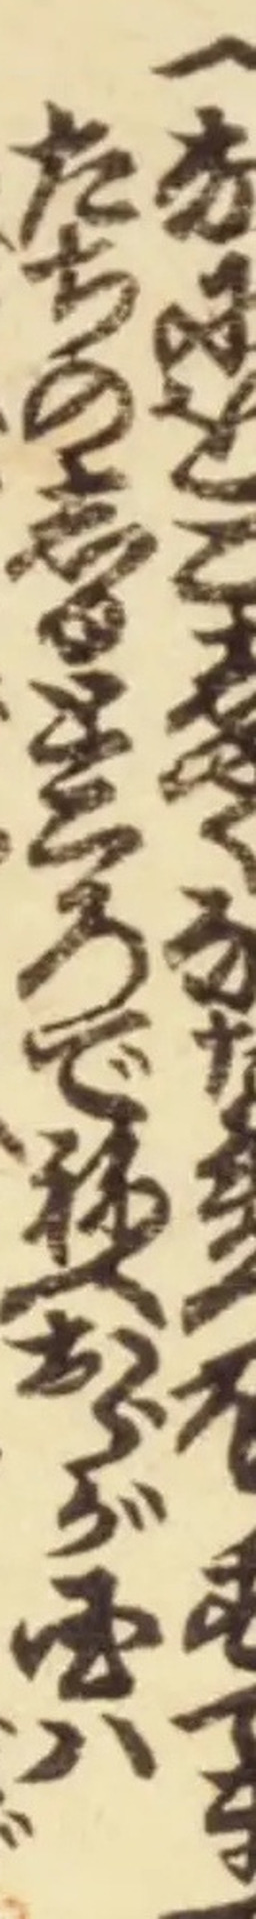たちのしるところでねへおらが国ハ
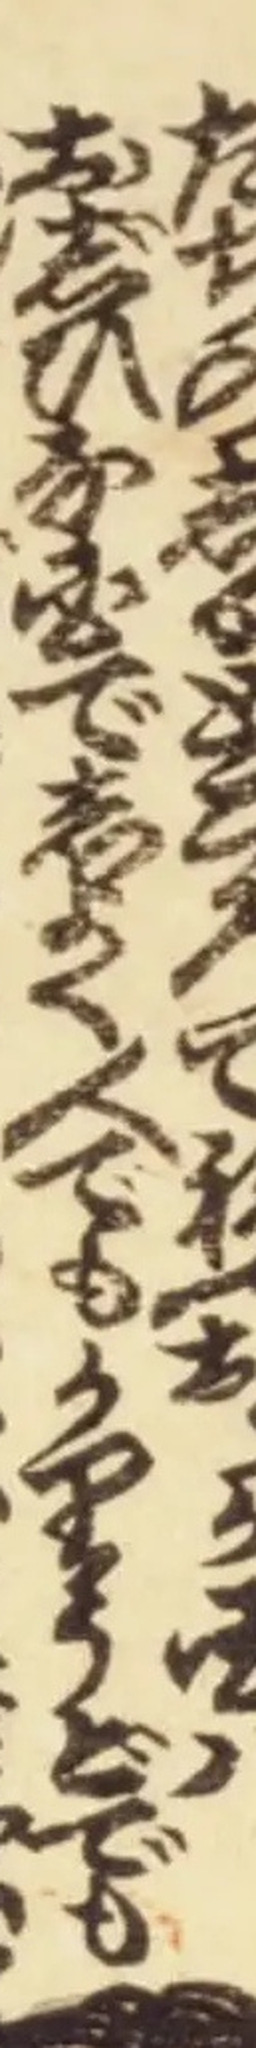おじひな国でしよく人でもかりうどでも
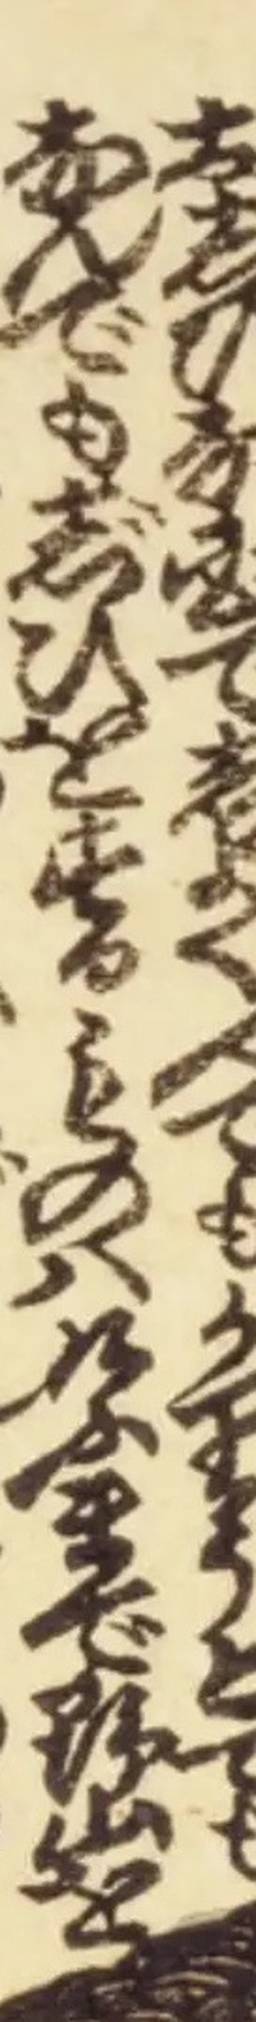なんでもじひをするものハけふまで野山を
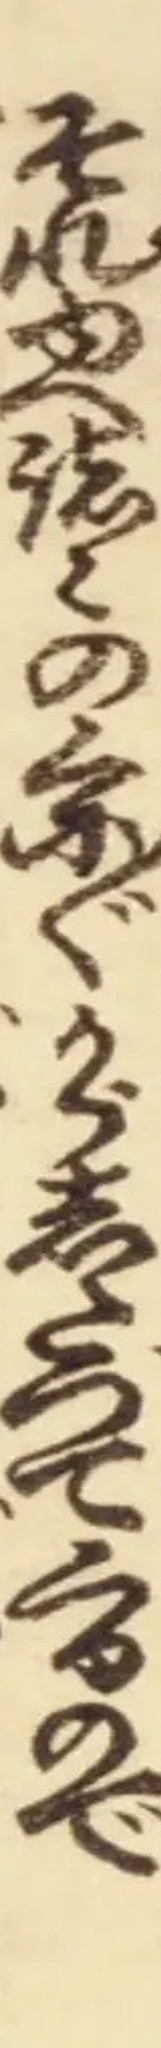それゆへ諸ゝのくに〴〵からしたつてくるので
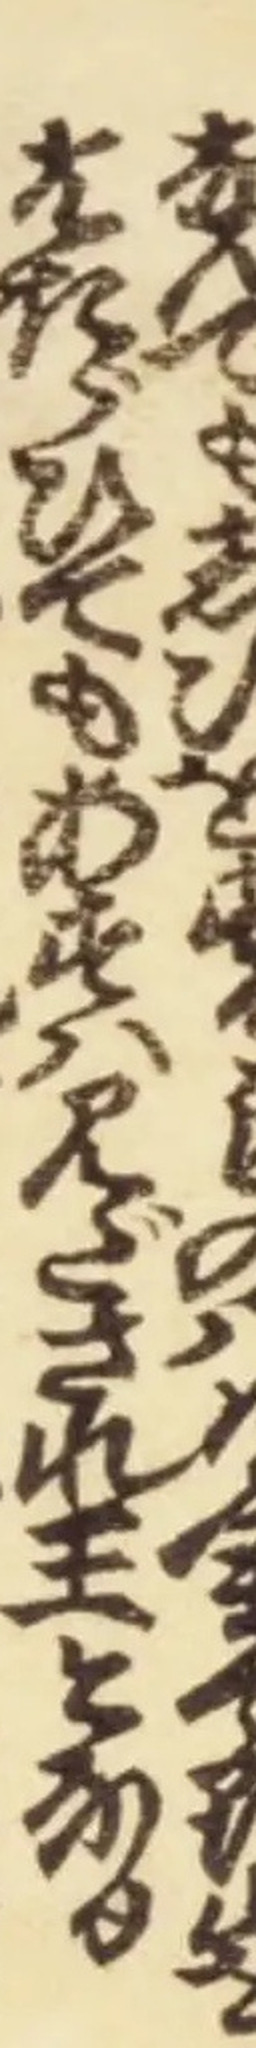はたらひてもあすハ見だされ王となる
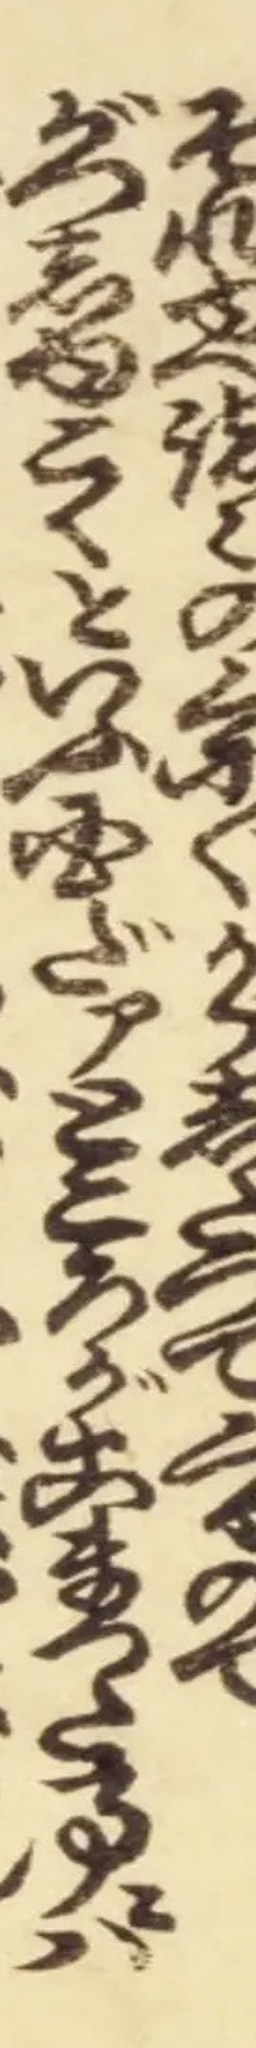がつしゆこくといふ国だアところがこまつた事ニハ
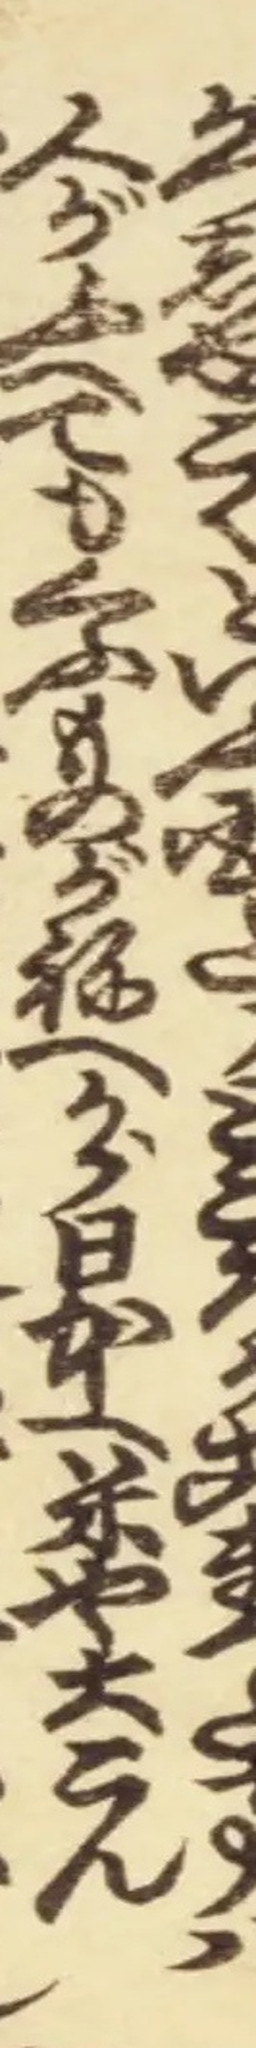人がふへてもくふものがねへから日本へ米や大こん
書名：安政二年十月二日夜大地震鯰問答
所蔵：国立国会図書館 National Diet Library, JAPAN
